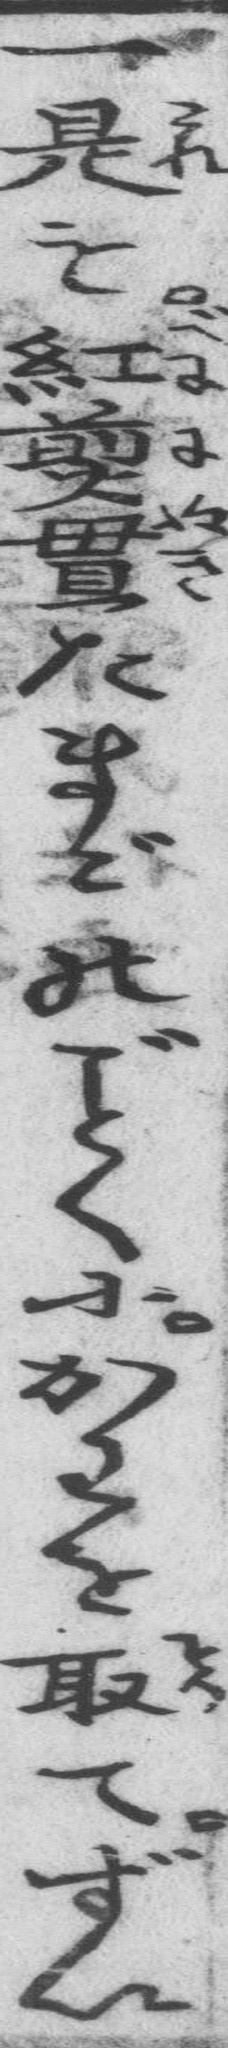一是も。紅煎貫たまごのごとくに。かわを取て。ずい
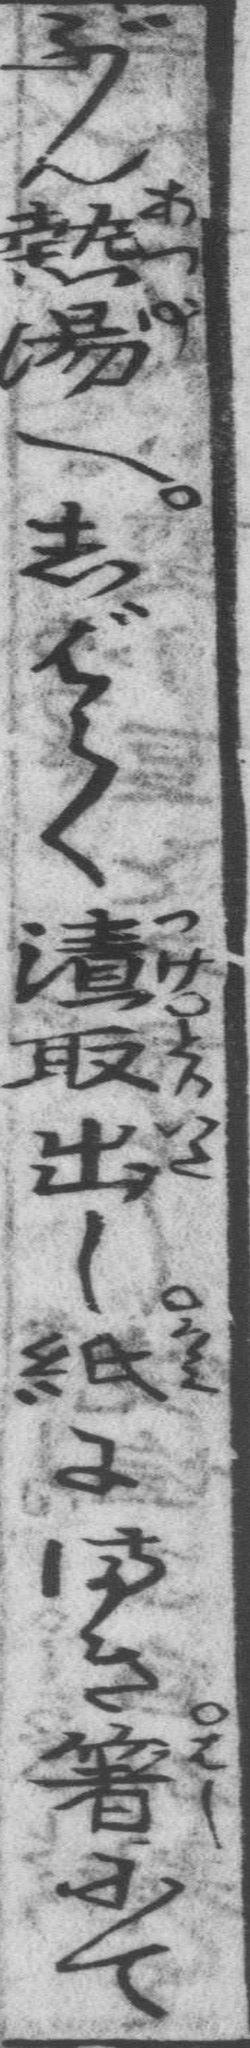ぶん熱湯へ。しばらく漬。取出し。紙にまき。箸にて
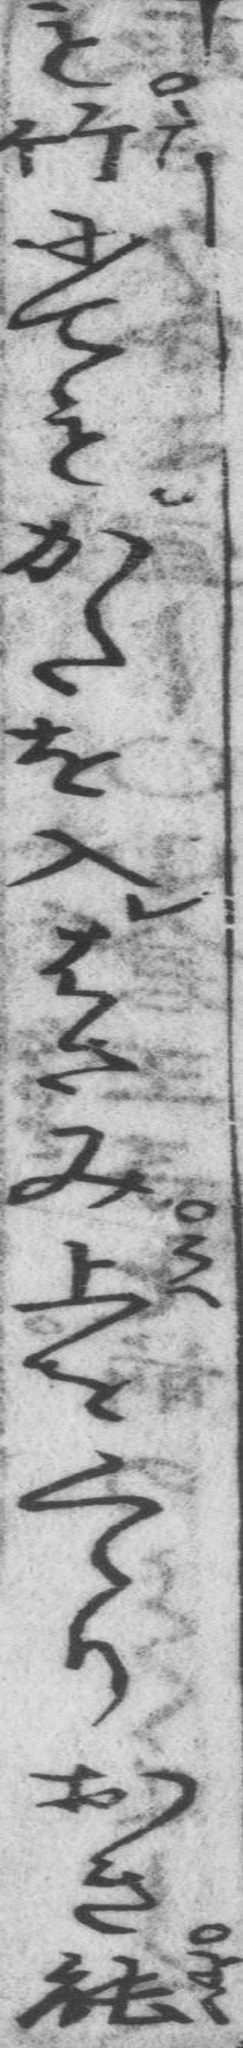も。竹にても。かたを入れはさみ。上をくゝりおき。能
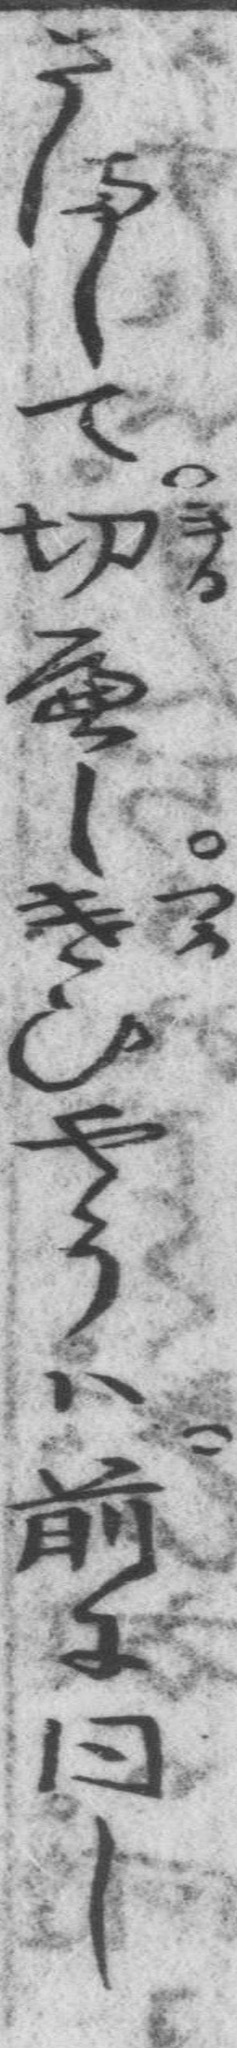さまして。切へし。遣ひやうは。前に同し
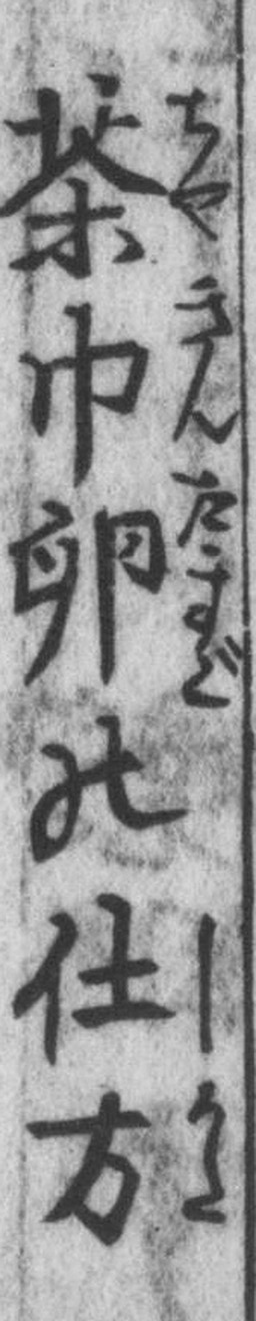茶巾卵の仕方
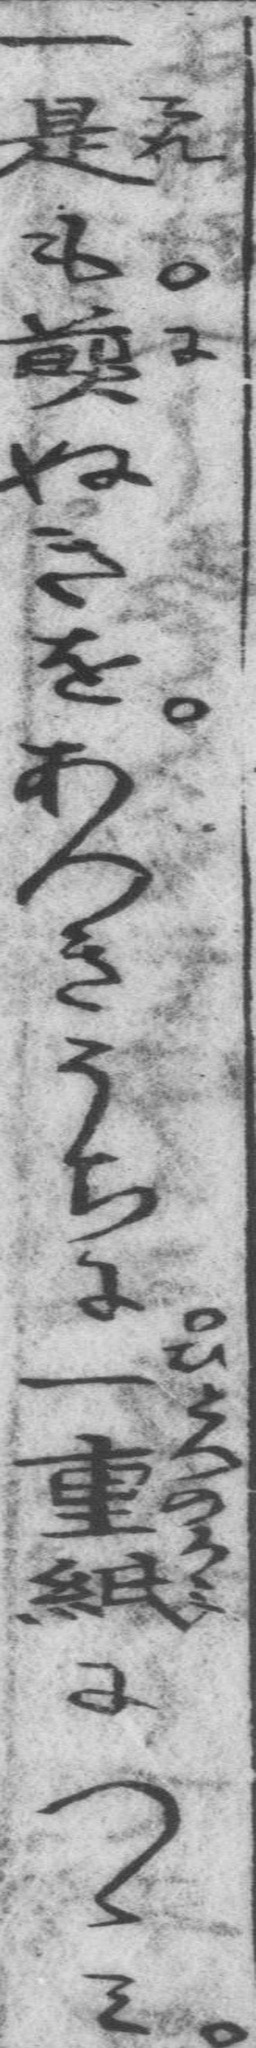一是も。煎ぬきを。あつきうちに。一重紙につゝみ。
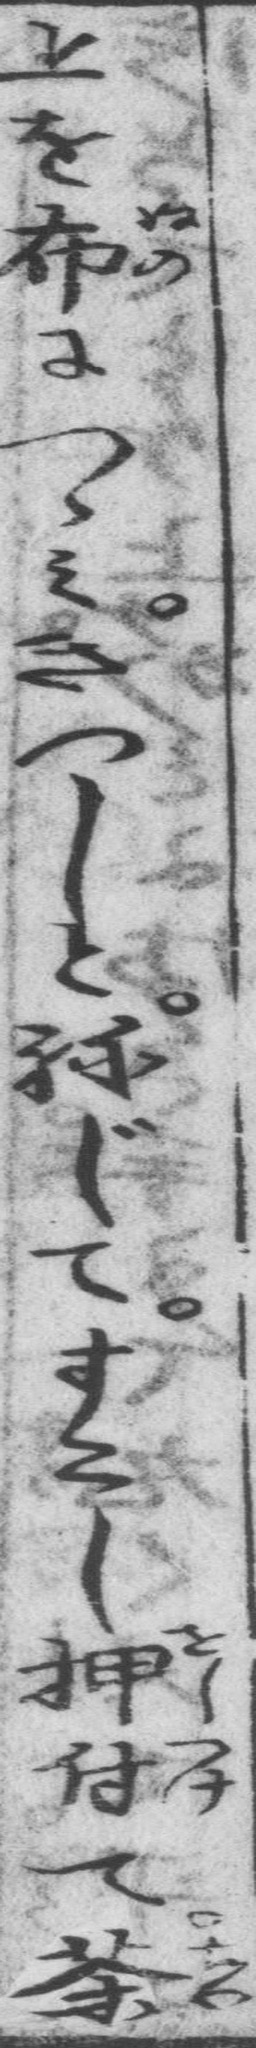上を布につゝみ。きつしと。ねじて。すこし押付て。茶
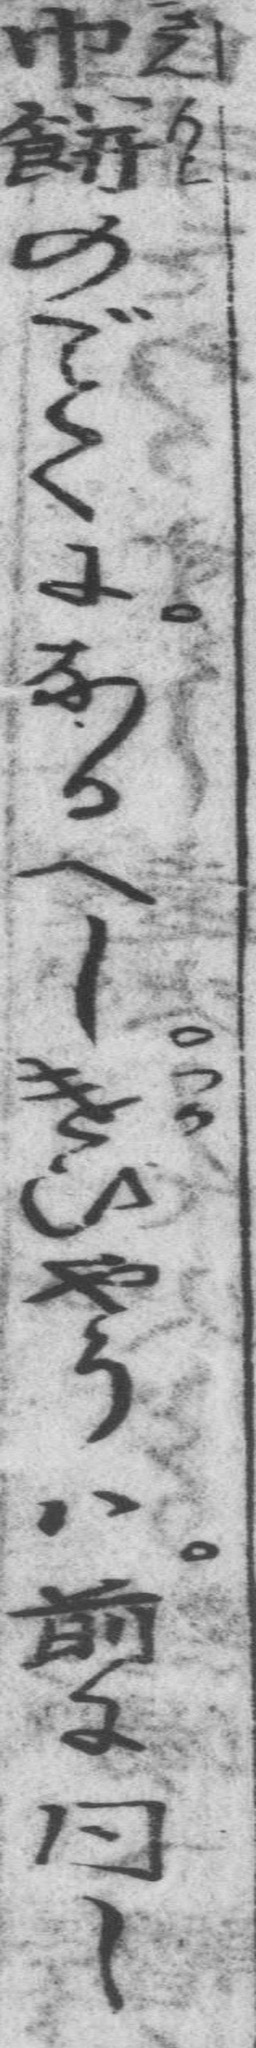巾餅のごとくに。なるへし。遣ひやうは。前に同し
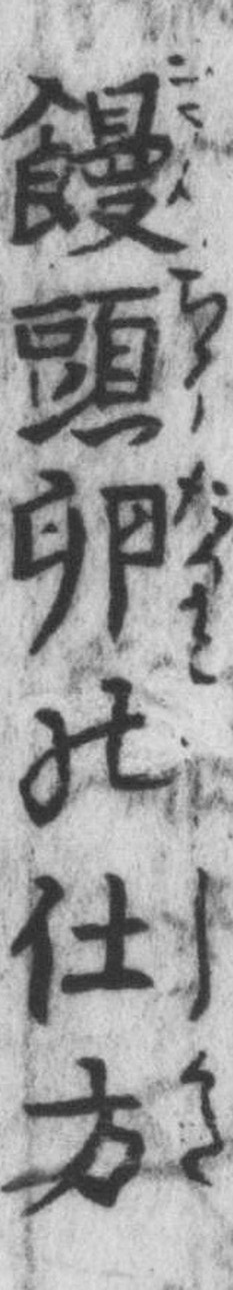饅頭卵の仕方
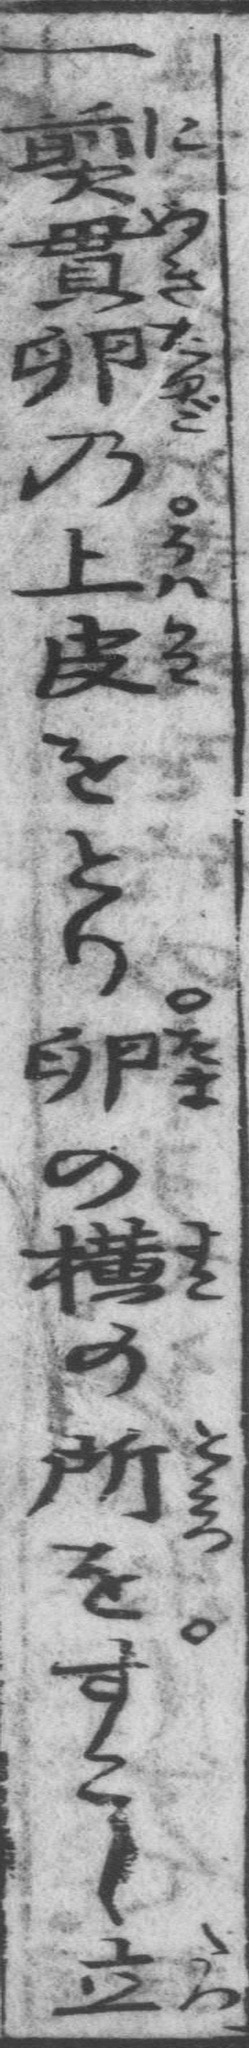一煎貫卵の。上皮をとり。卵の横の所を。すこし立

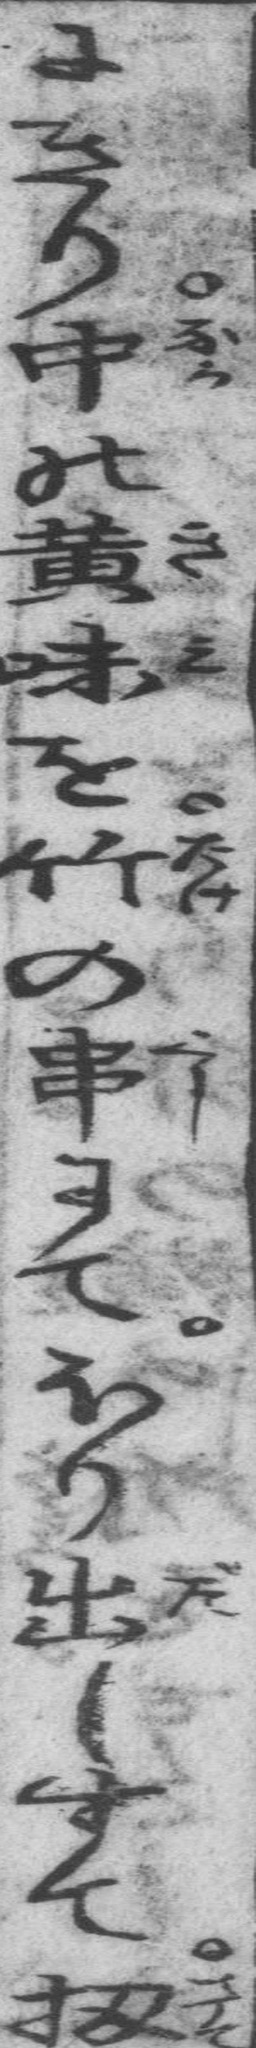にきり。中の黄味を。竹の串にて。ほり出しすて。扨
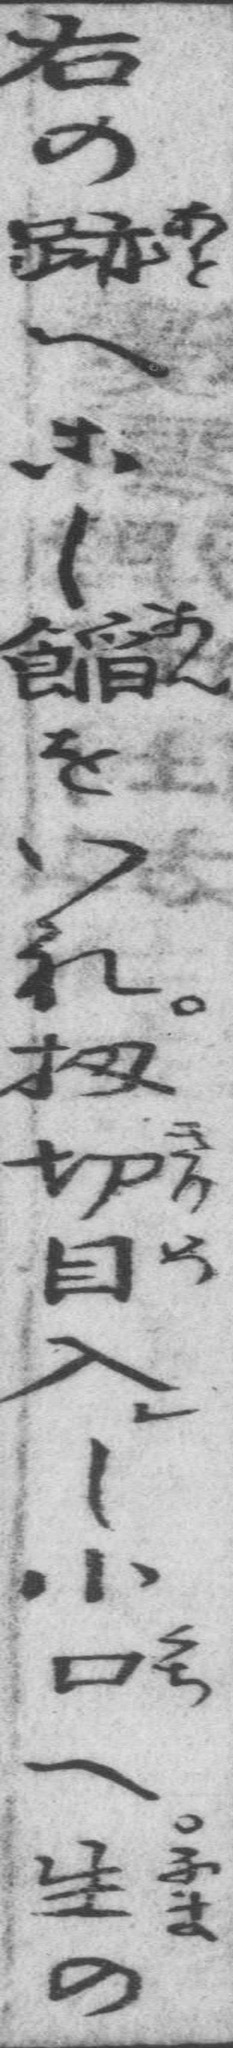右の跡へこし餡をいれ。扨切目入れし小口へ。生の
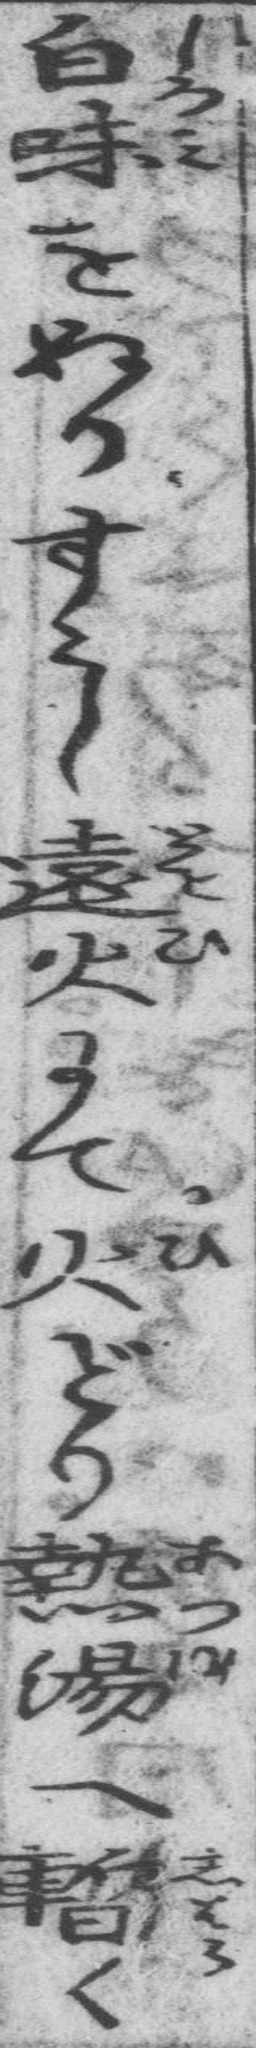白味をぬり。すこし遠火にて。火どり熱湯へ暫く
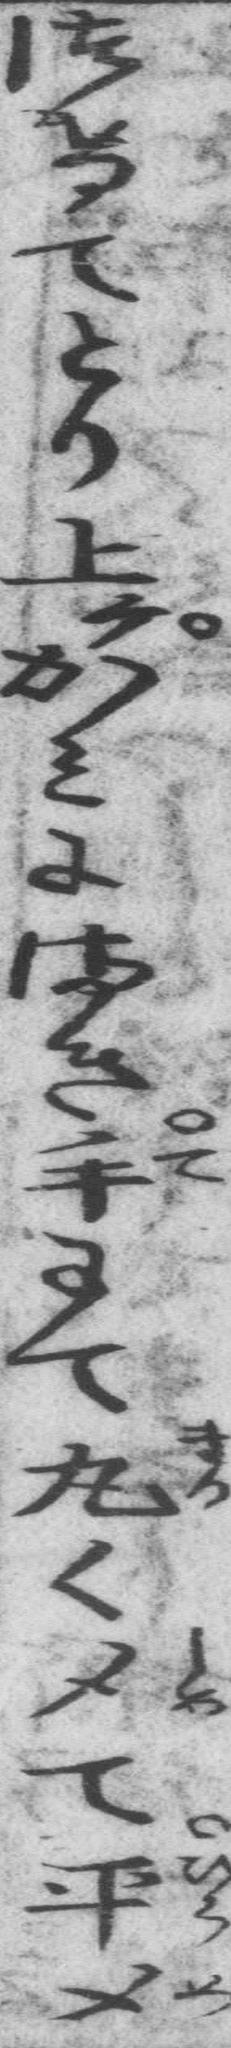つけてとり上け。かみにまき。手にて丸く〆て。平メ
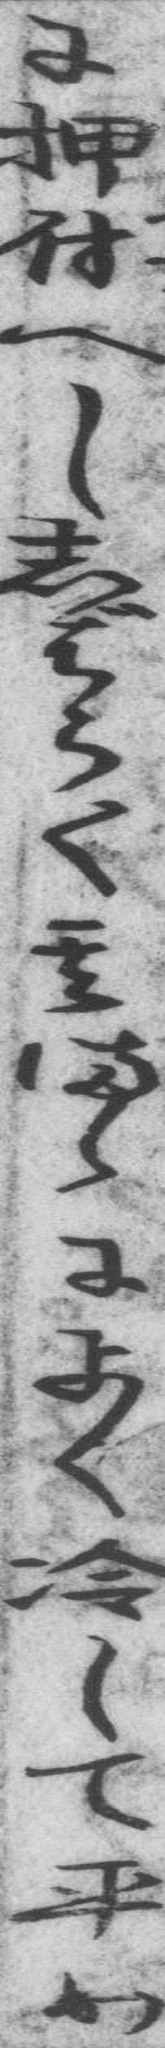に押付へし。しばらく其まゝに。よく冷して。平め
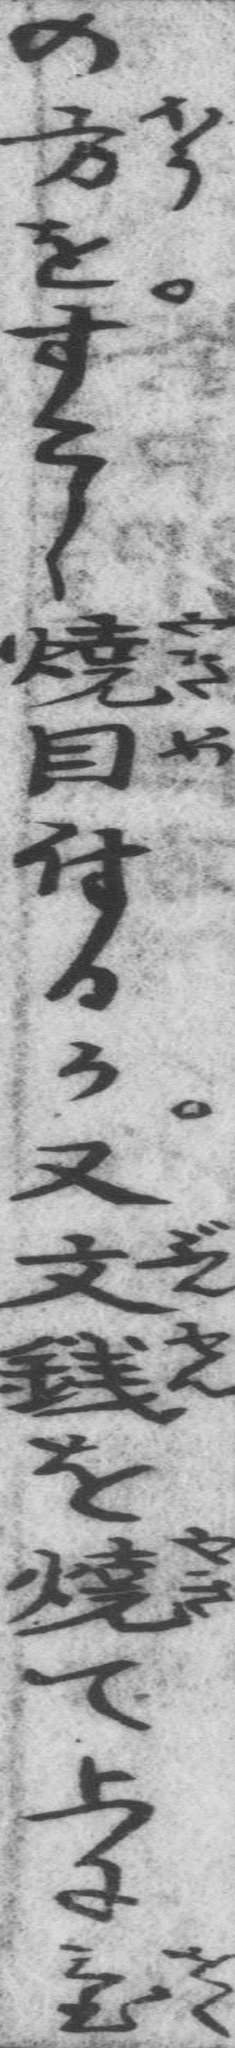の方を。すこし焼目付るか。又文銭を焼て上に置
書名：萬寳料理秘密箱
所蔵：大阪府立大学学術情報センター 国文学研究資料館
